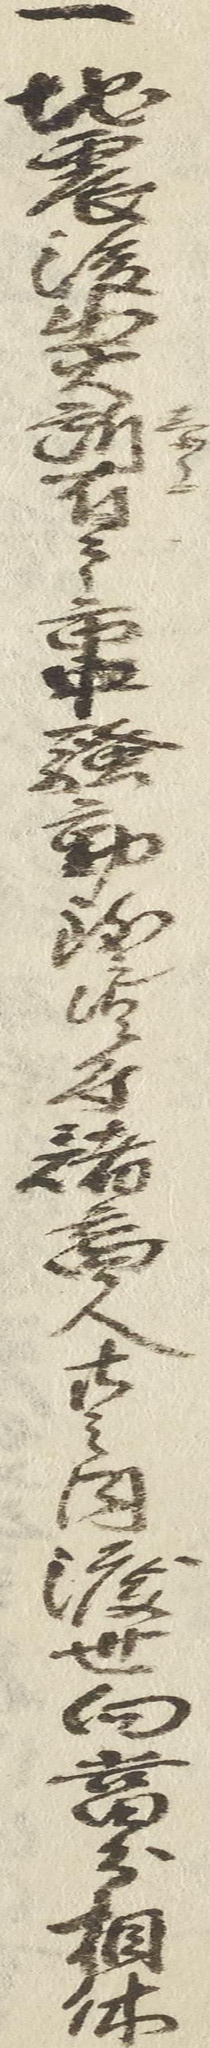一地震後出火所有て市中騒動致侯に付諸商人共之内渡世向当分相休
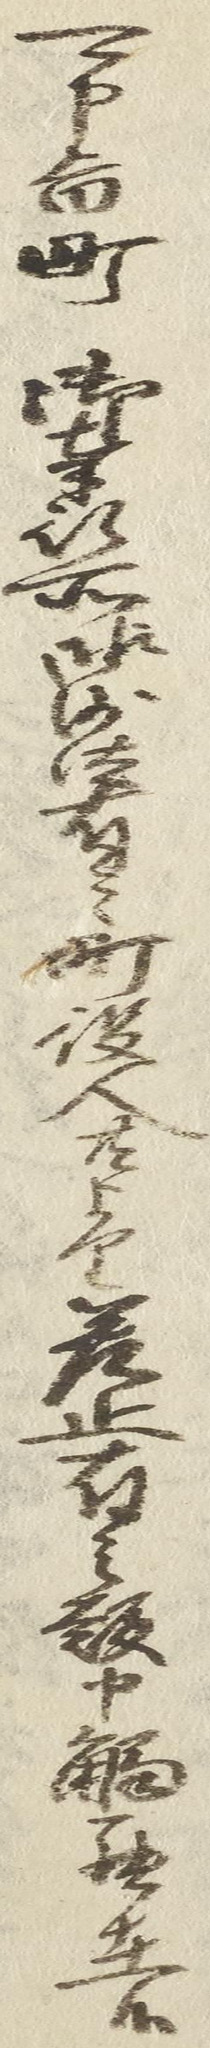可申旨町御奉行所江御沙汰有之町役人共より差止有之趣申觸罷在侯
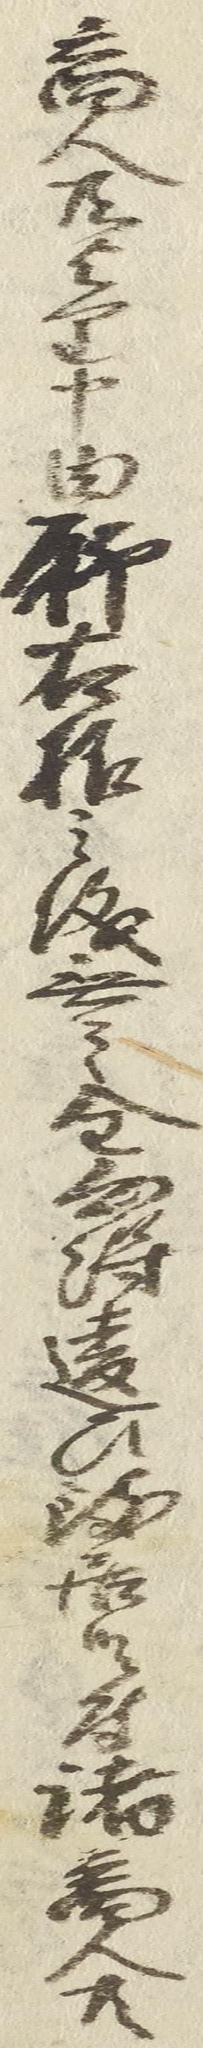商人共より申由聊右様の儀無之令心得違ひ致居候付諸商人共
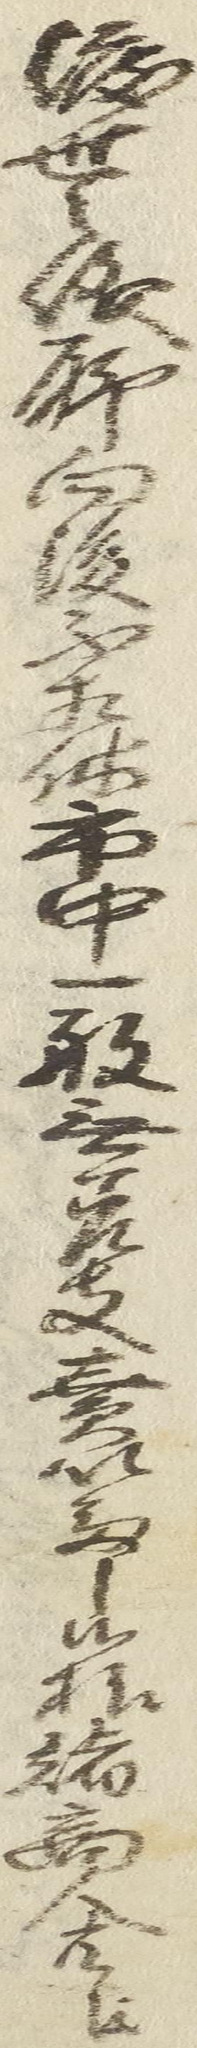渡世之儀聊向後不相休市中一般無差支売いたし候様諸商人共江
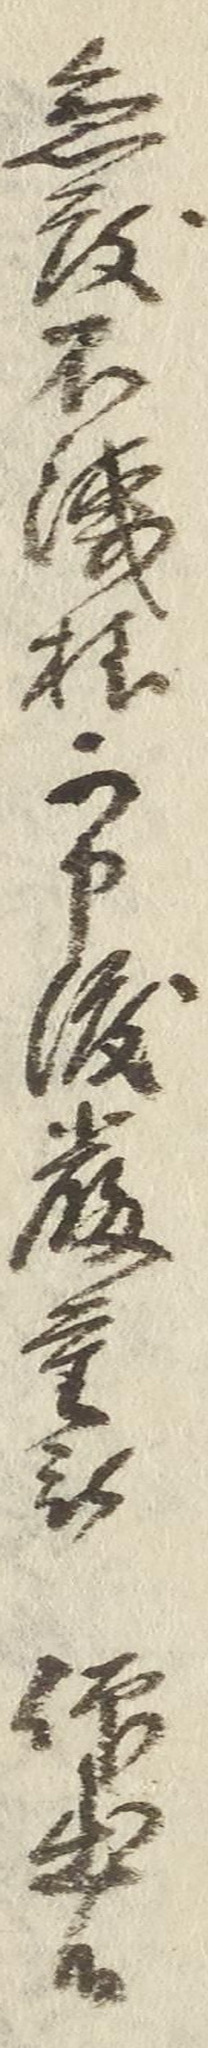急度不洩様可申渡厳重被仰出候

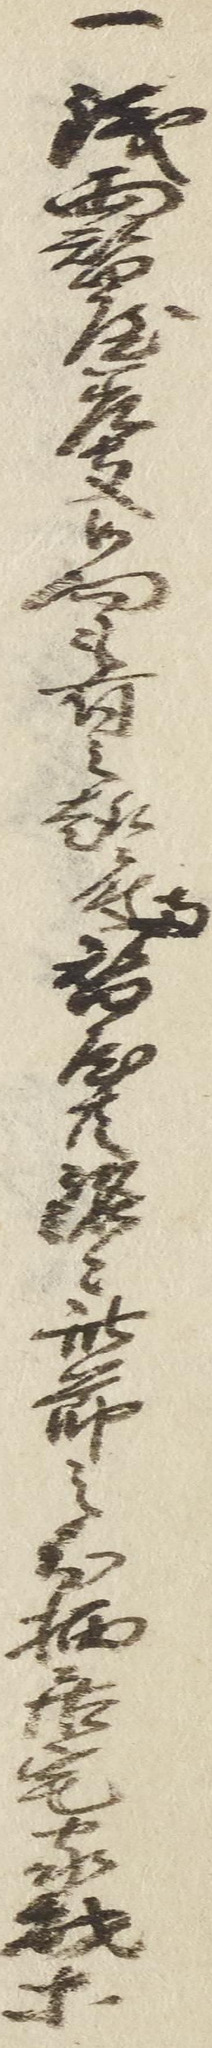一銭両替屋差支侯向も有之趣に付両替屋共銘々此節之分柄居宅家財等
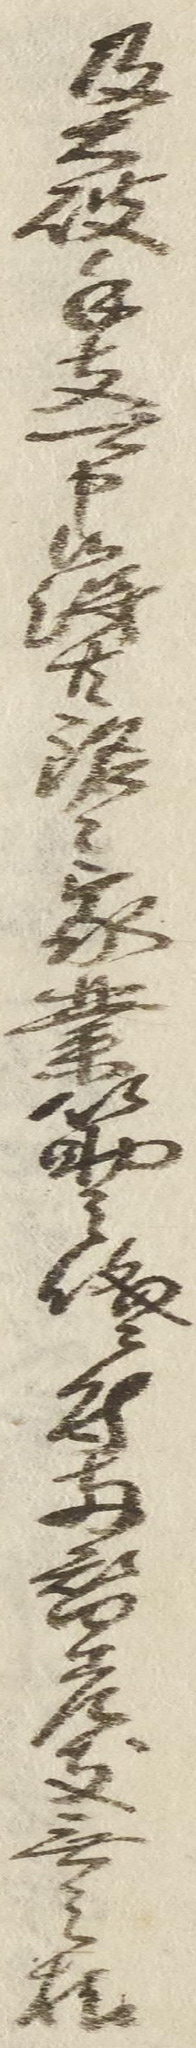及大破手支可申候得共銘々家業筋之儀二付両替差支無之様
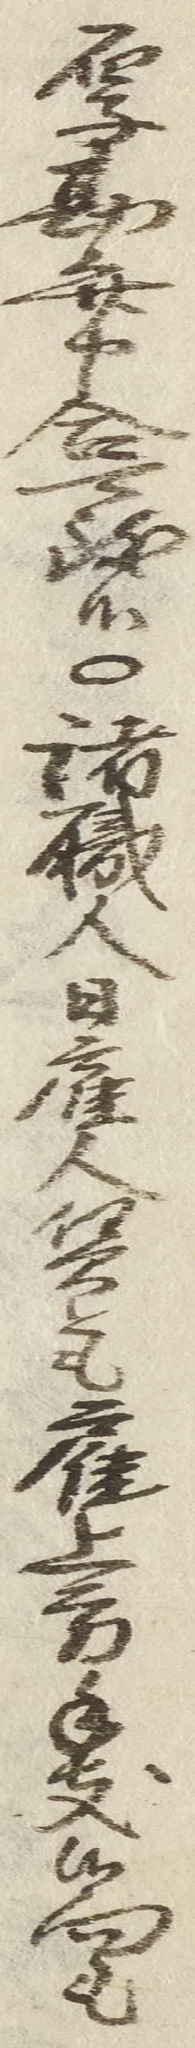厚勘弁申合可致侯◯諸職人日雇人賃とも雇上方手支候向も
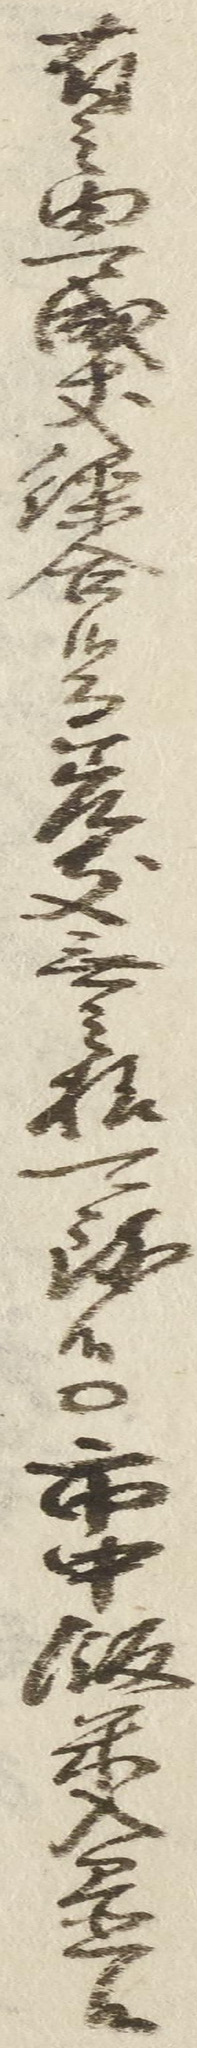有之由可成丈繰合侯而差支無之様可致侯◯市中飯米入置侯
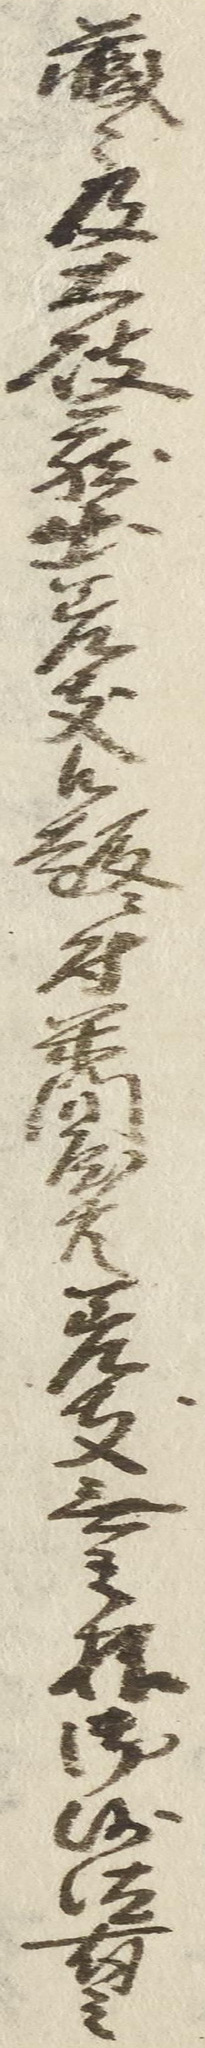蔵々及大破蔵出差支侯趣二付米問屋共差支無之様御沙汰有之
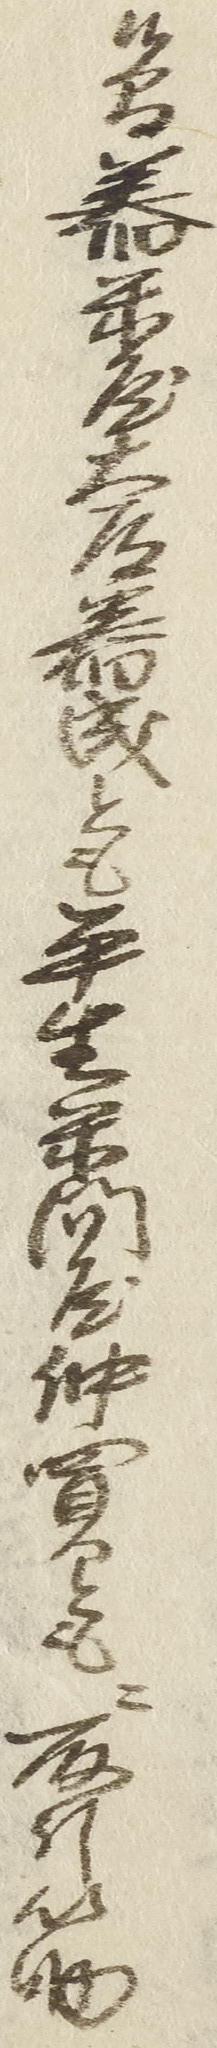侯間舂米屋大道舂成とも平生米問屋仲買ともに取引筋
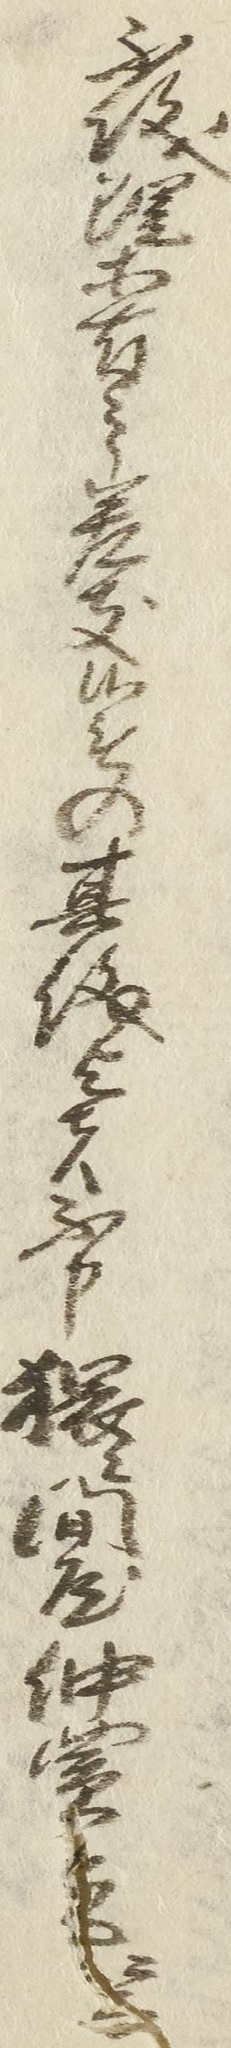不儀理等有之差支侯もの其儀とは不申猥二問屋仲買内二而
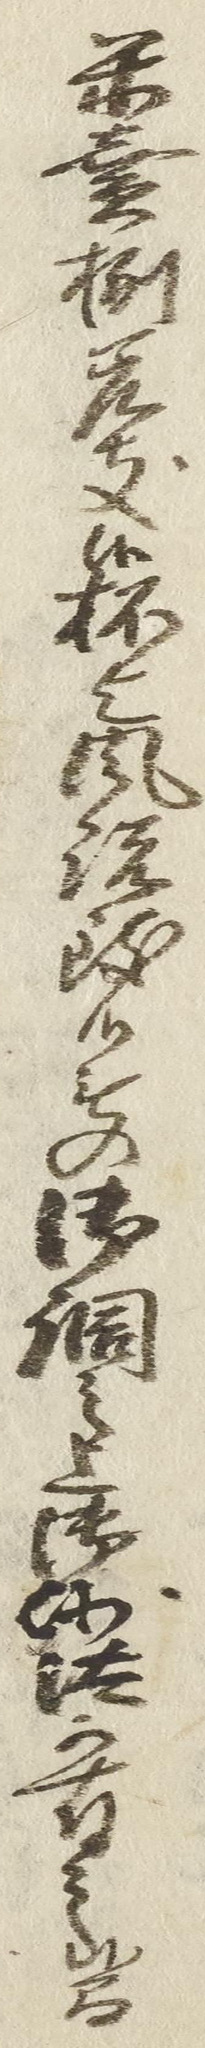米売捌差支侯抔と風説致侯もの御調之上御沙汰可有之侯間
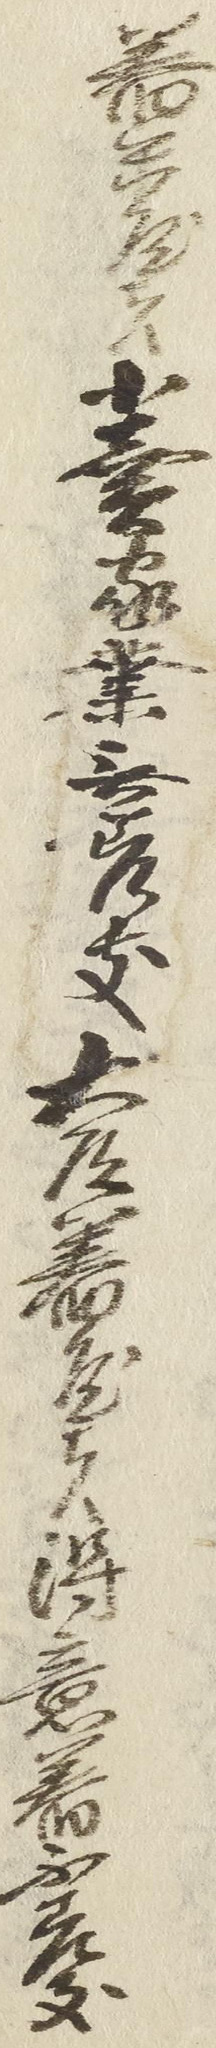券番屋は小売家業無差支大道舂屋は得意舂不差支
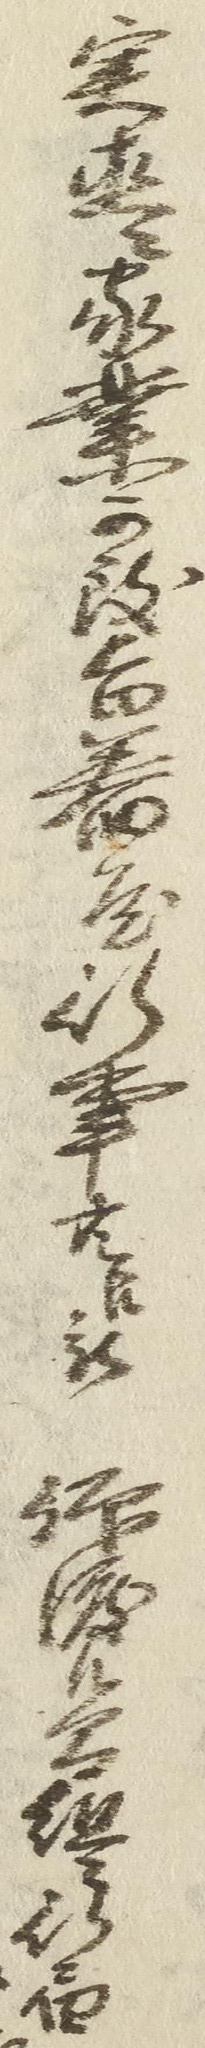実直に家業可致旨舂屋行事共江被仰渡侯間組々行届
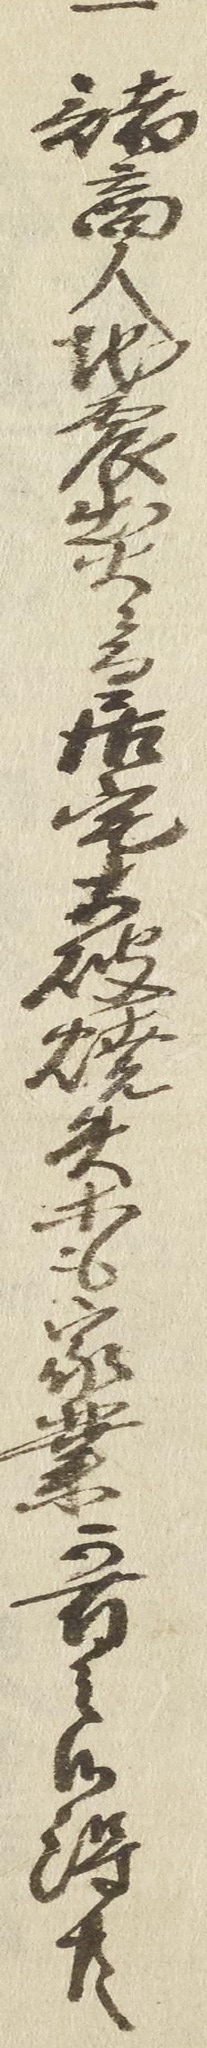一諸商人地震出火二而居宅大破焼失等も家業可有之候得共
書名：従往古地震御届書記誌之一
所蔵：東京大学地震研究所図書室 Earthquake Research Institute Library, The University of Tokyo, JAPAN
